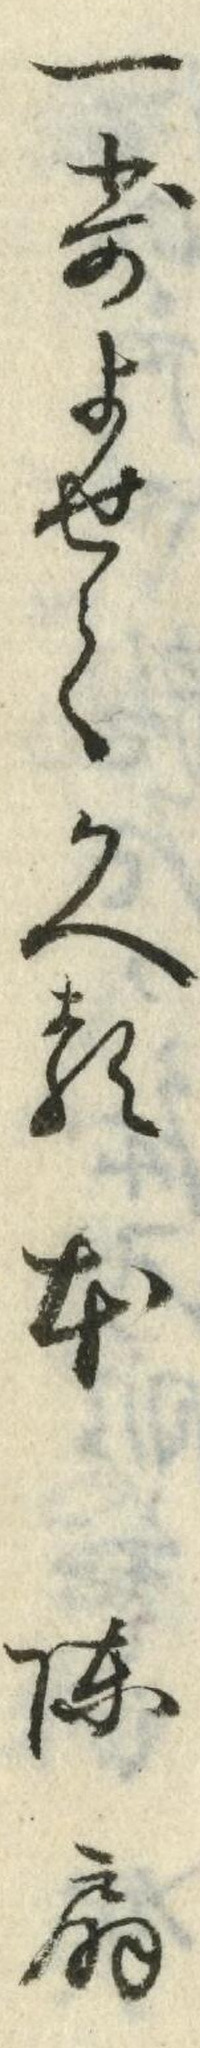一寄よせてかへる本陣扇
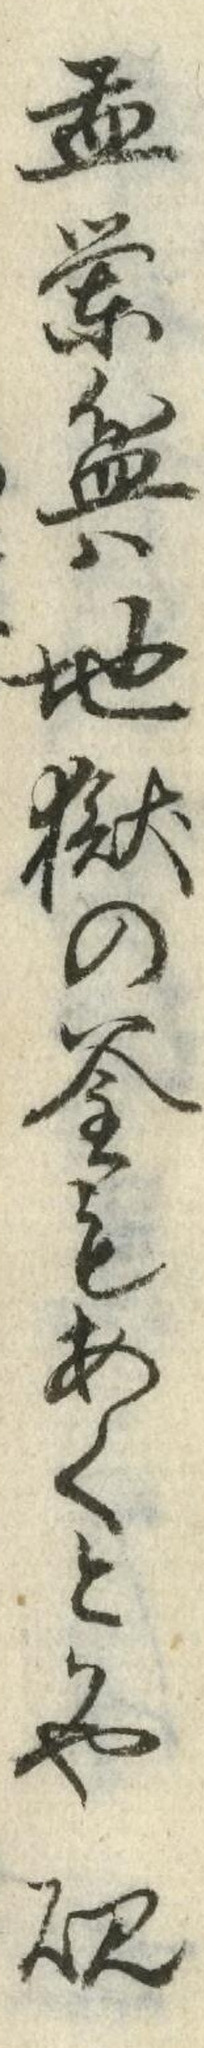盂蘭盆は地獄の釜もあくとかや硯
